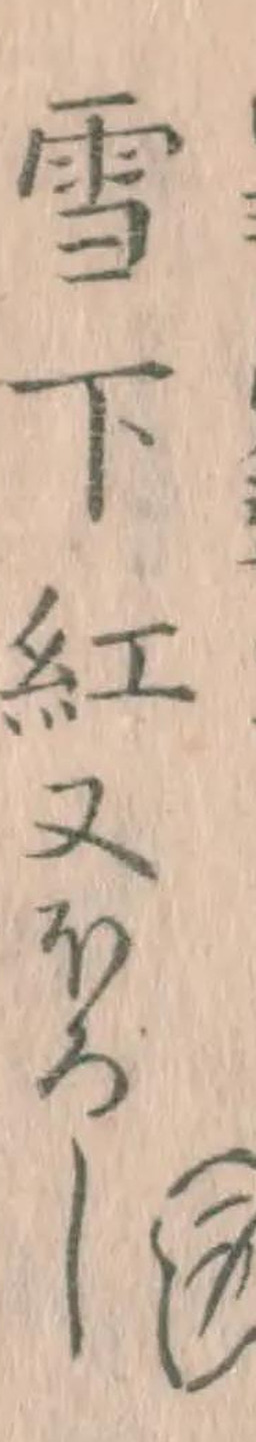雪下紅又ほろし
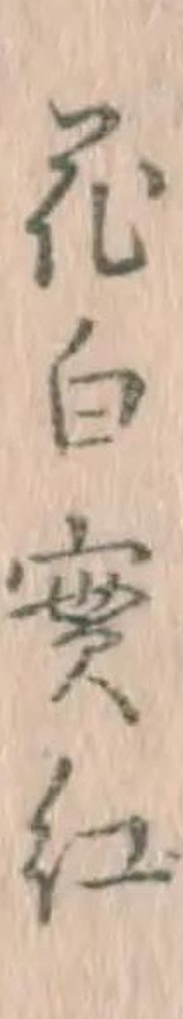花白実紅
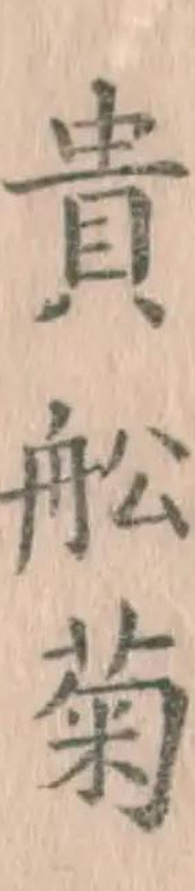貴船菊
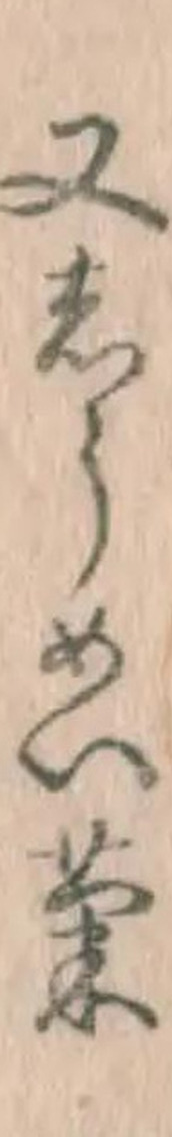又しうめい菊
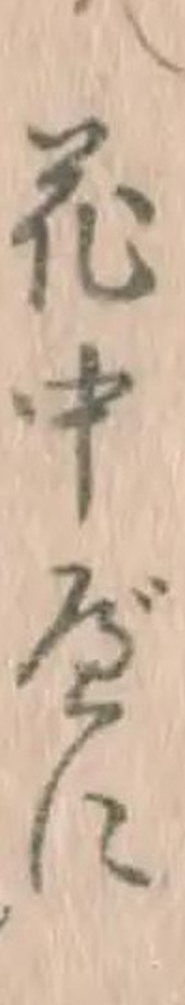花中べに

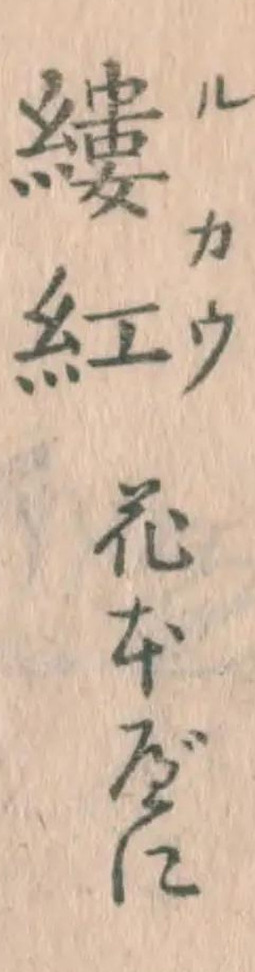縷紅花本べに
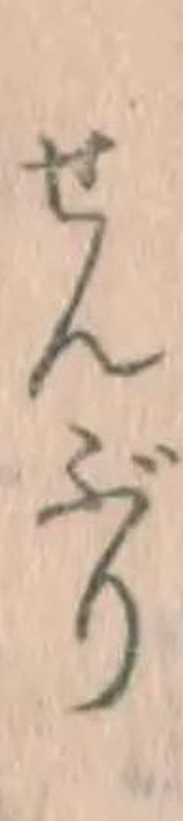せんぶり
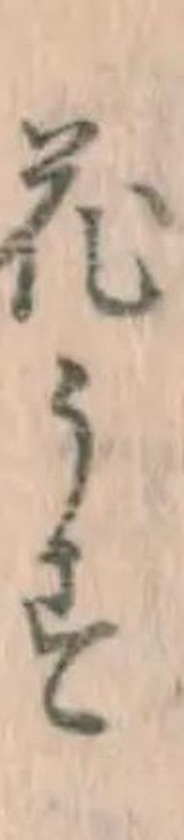花うす
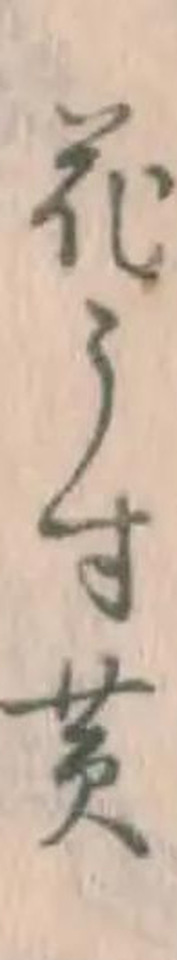花うす黄

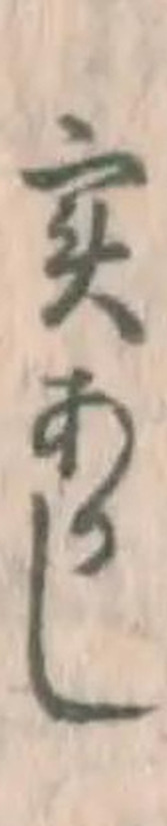実あかし
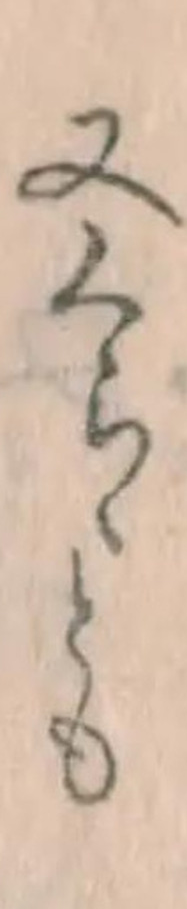又くらゝとも
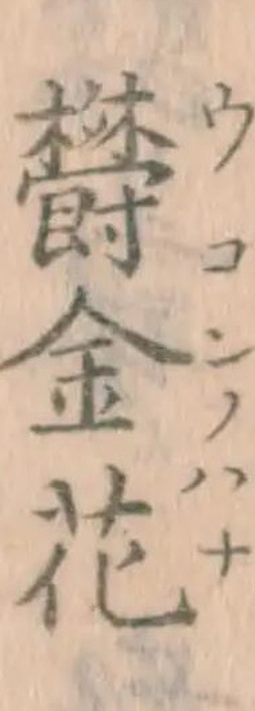鬱金花
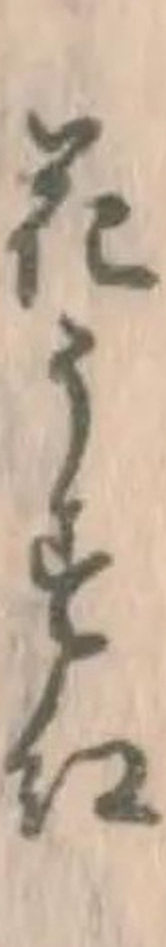花うす紅
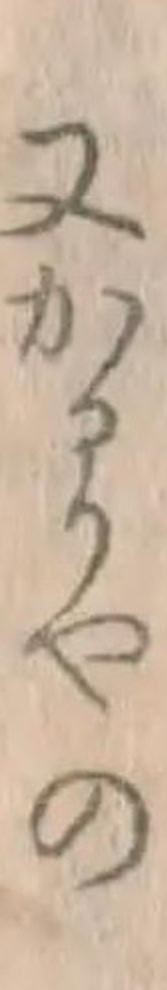又かるかやの
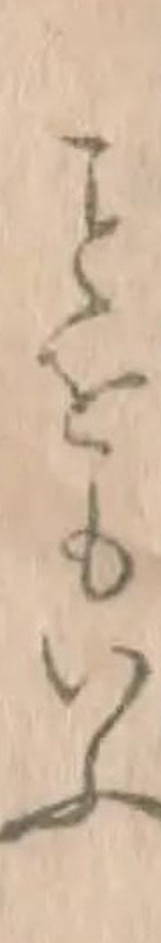ことををもいふ

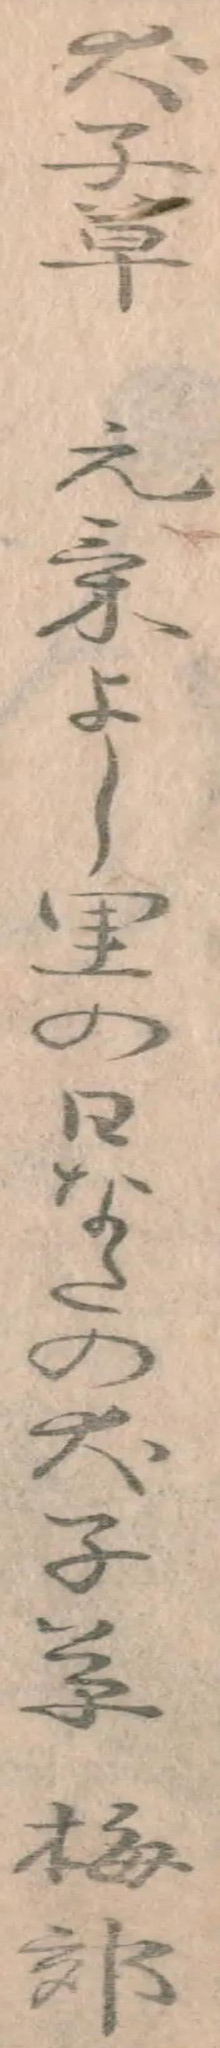犬子草元気よし里の日なたの犬子草梅郊
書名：誹諧名知折 2巻. [2]
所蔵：国立国会図書館 National Diet Library, JAPAN
